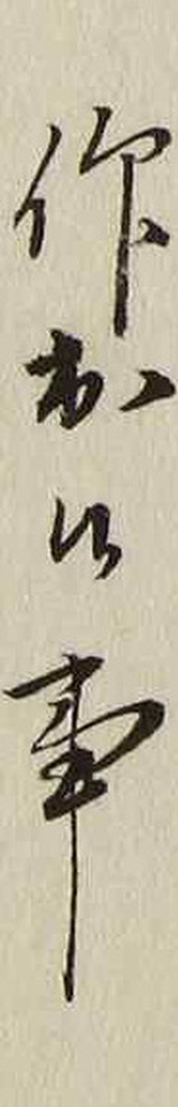仰出候事
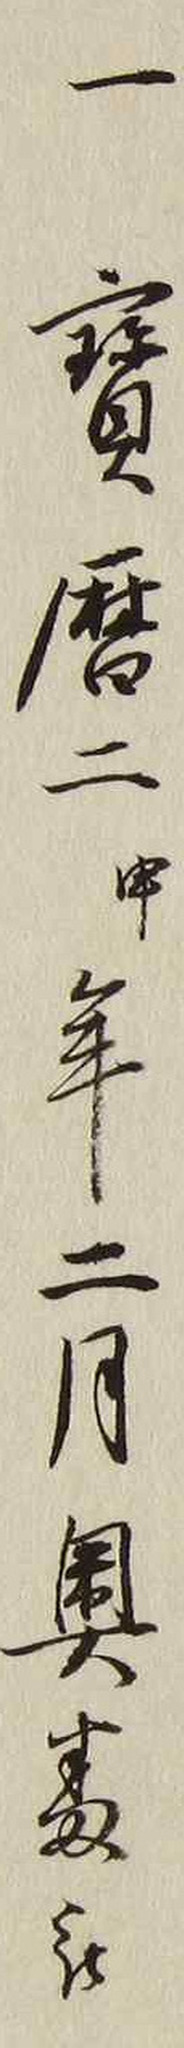一宝暦二申年二月奥番被
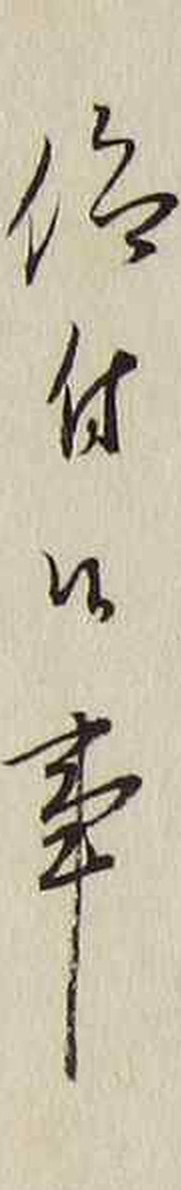仰付候事
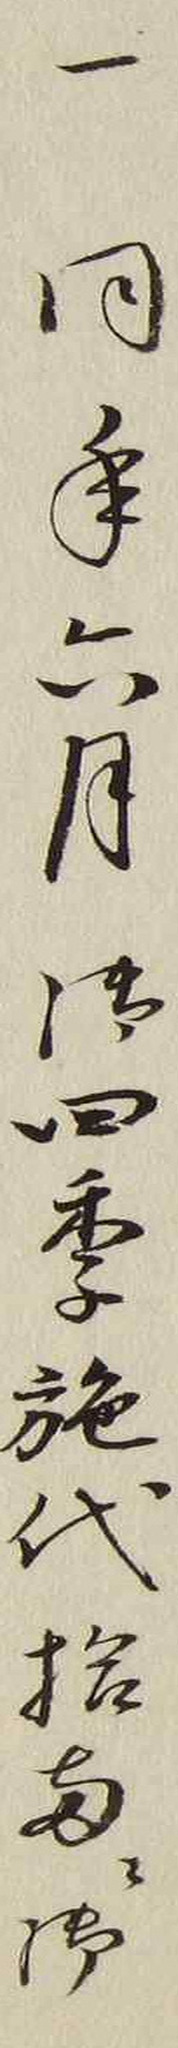一同年六月御四季施代拾両ニ御

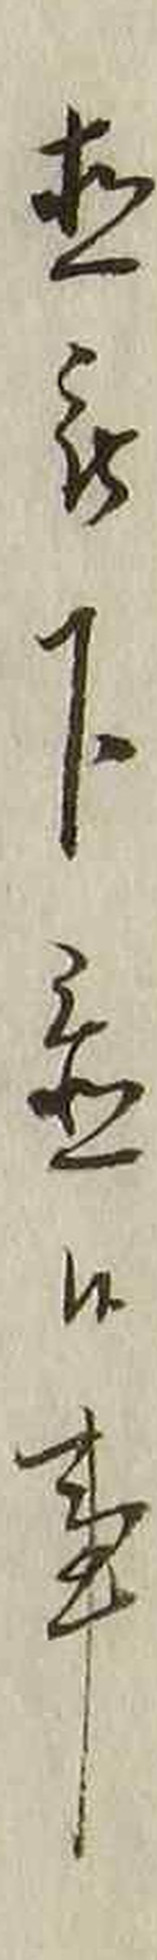直被下置候事
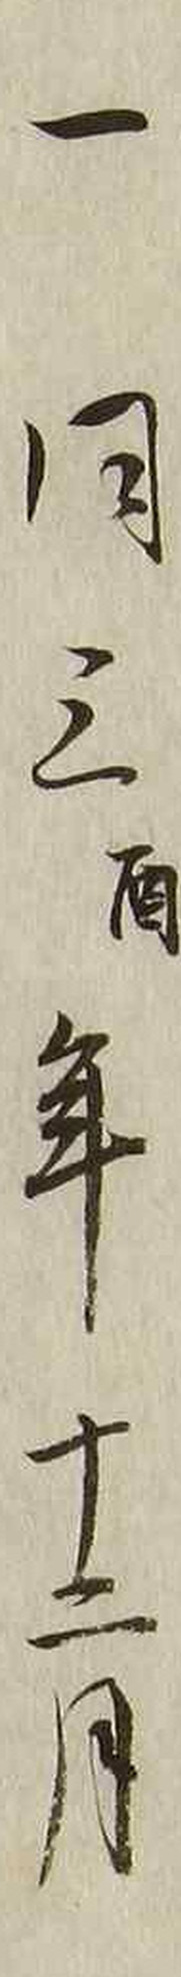一同三酉年十二月
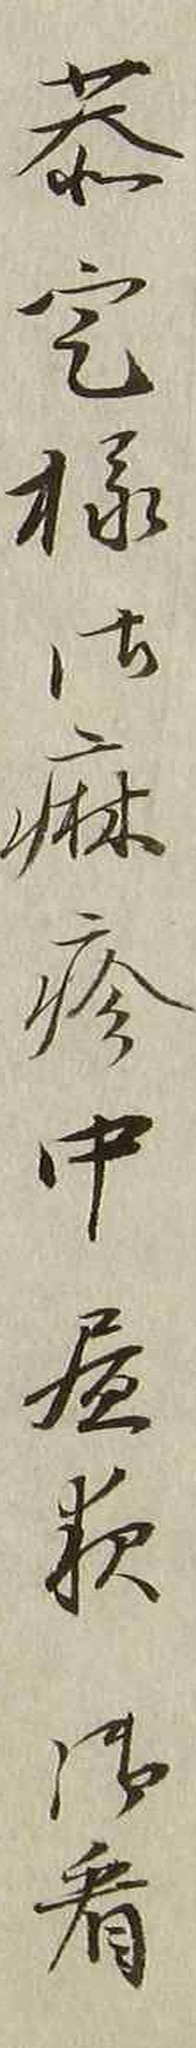恭定様御麻疹中昼夜御看
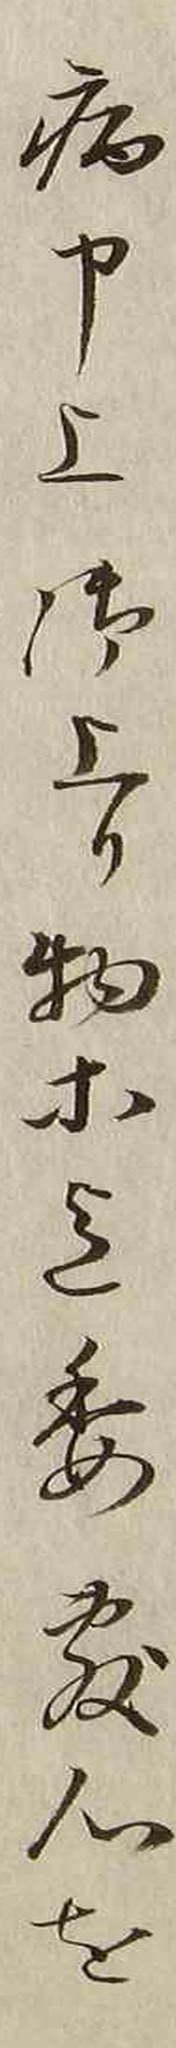病申上御上り物等迄委敷心を
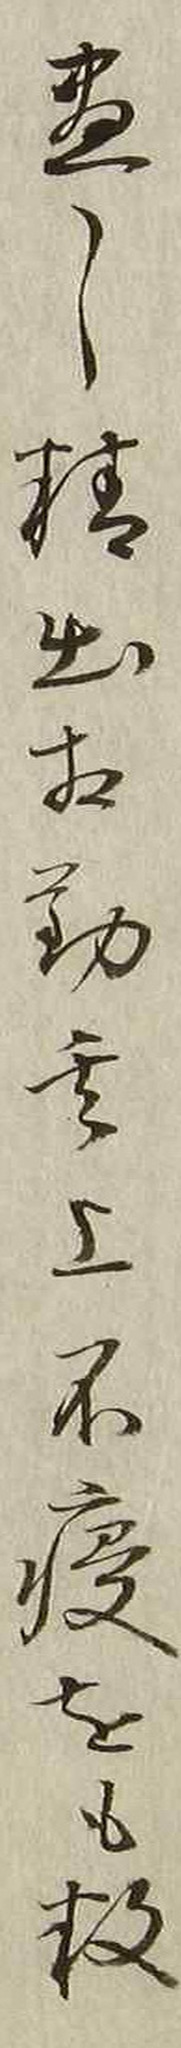尽し精出相勤其上不寝をも数
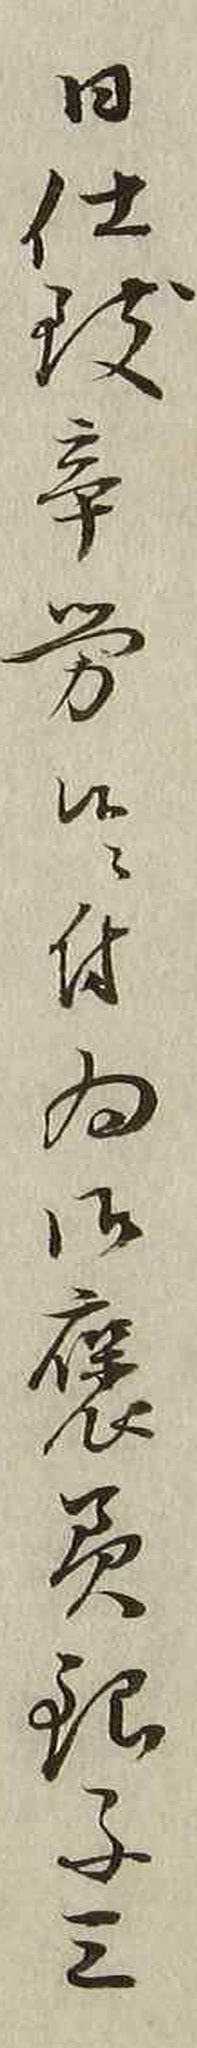日仕致辛労候ニ付為御褒美銀子三
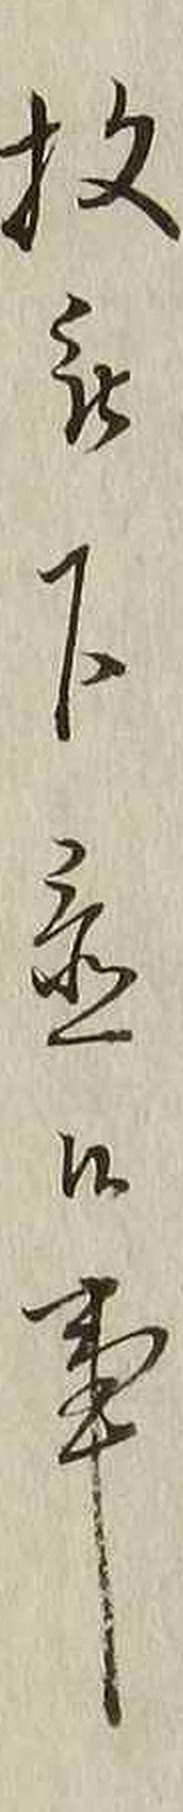枚被下置候事
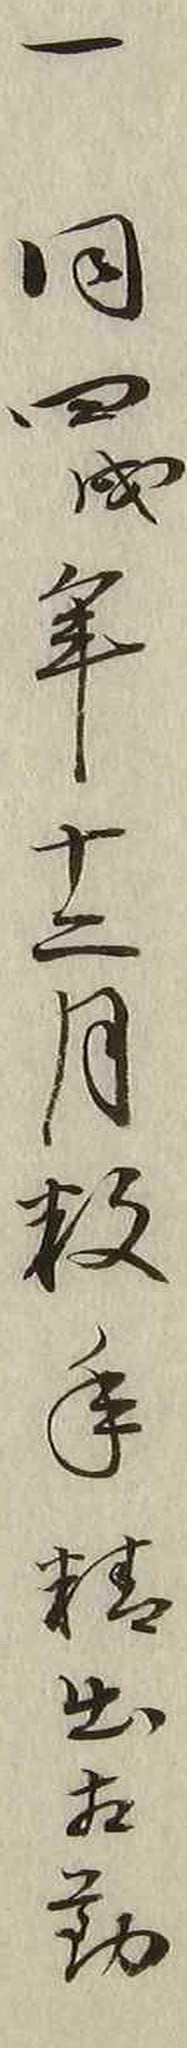一同四戌年十二月数年精出相勤
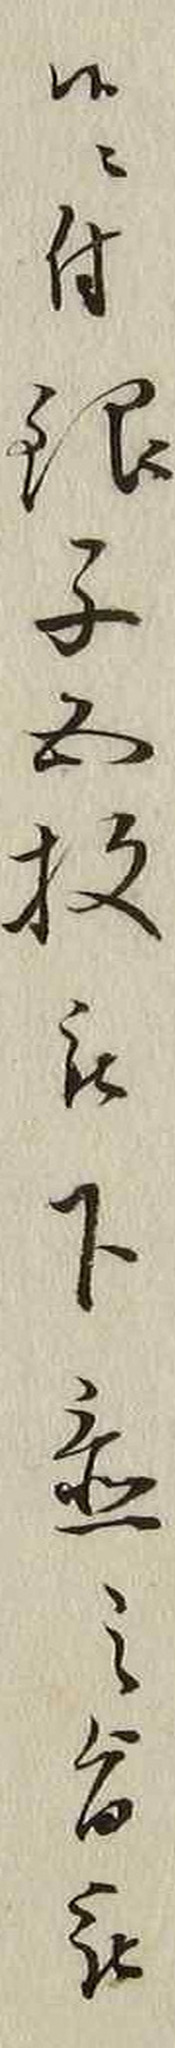候ニ付銀子五枚被下置之旨被
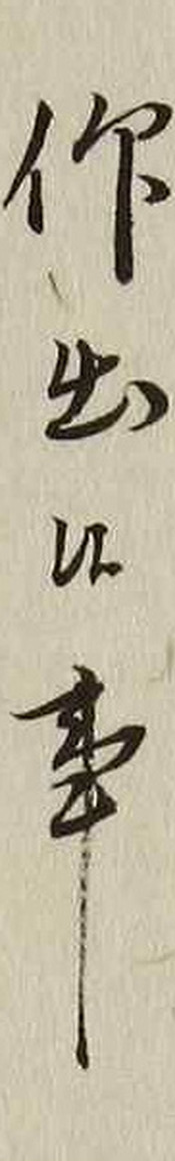仰出候事
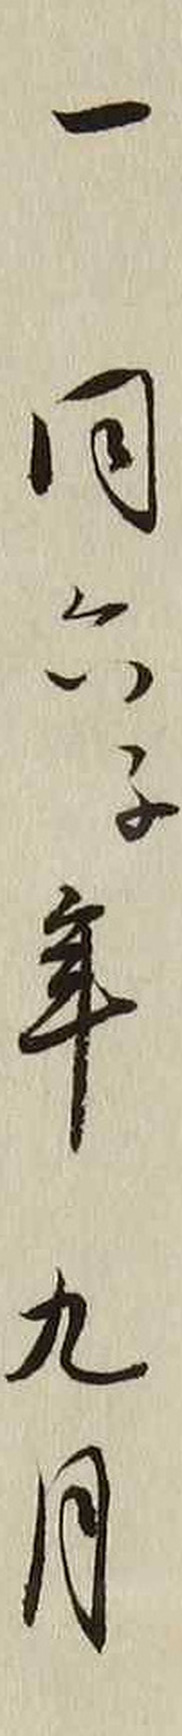一同六子年九月
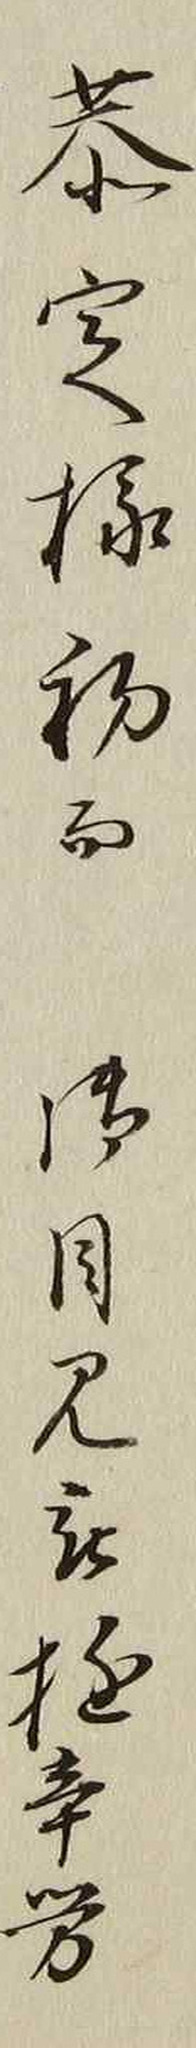恭定様初而御目見被遊辛労
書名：諸士系譜　巻之22　い之部22
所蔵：会津若松市立会津図書館
